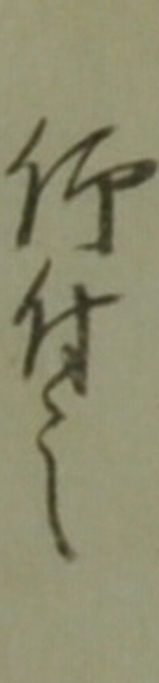仰付之
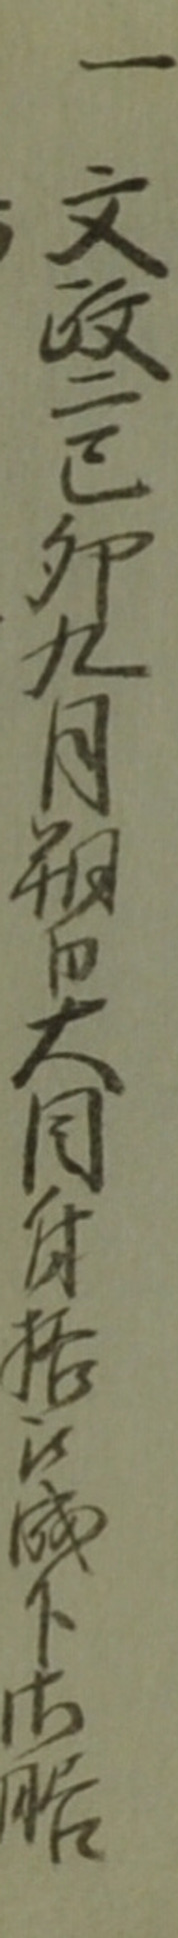一文政二己卯九月朔日大目付格被成下御膳
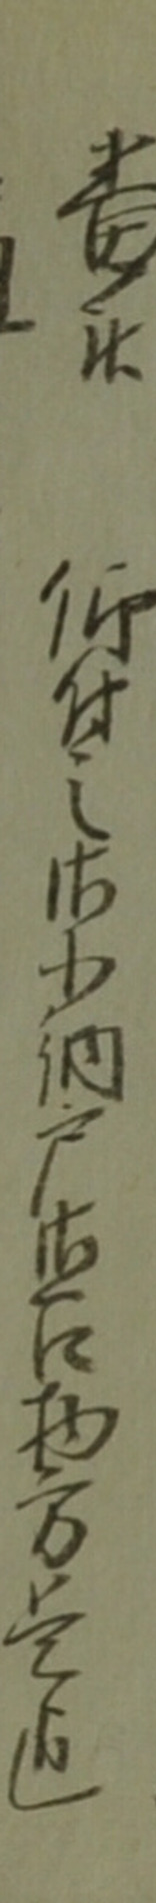番被仰付之御小納戸御召物方是迄
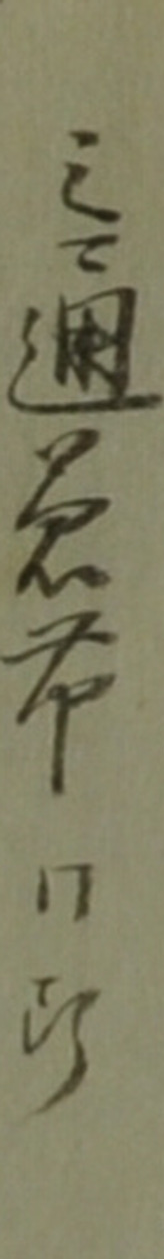之通兼帯同断
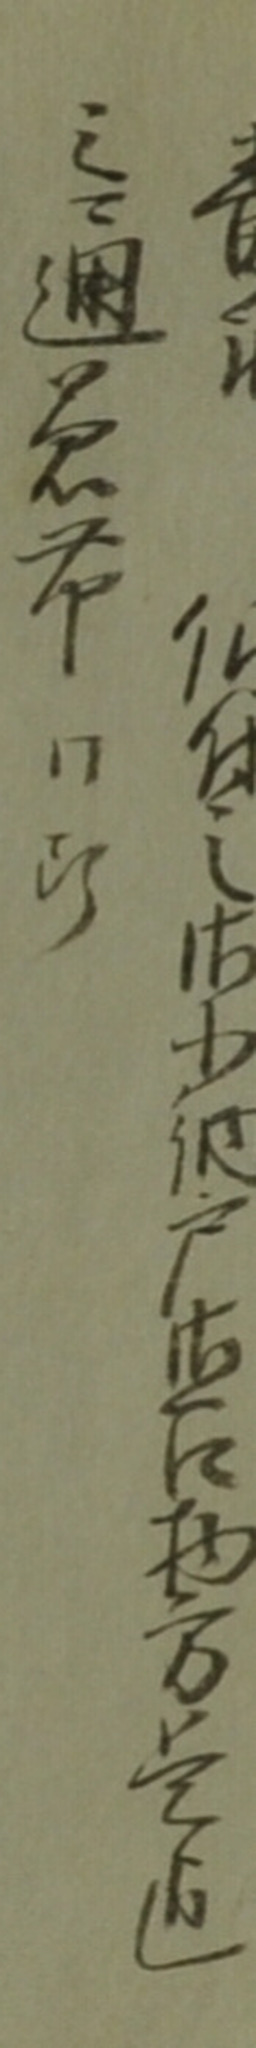之通兼帯同断
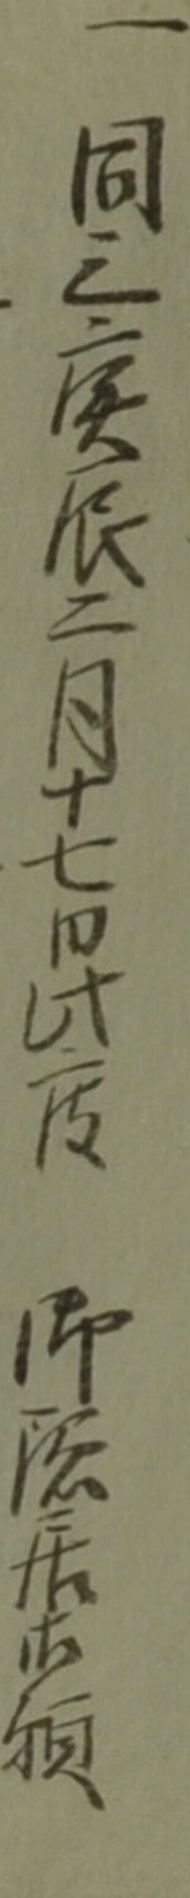一同三庚辰二月十七日此度御隠居御願
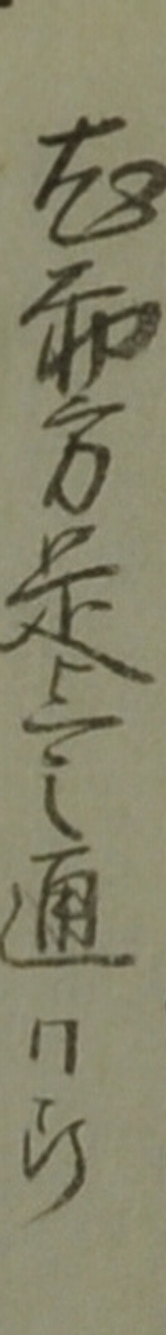尤勤方是迄之通同断
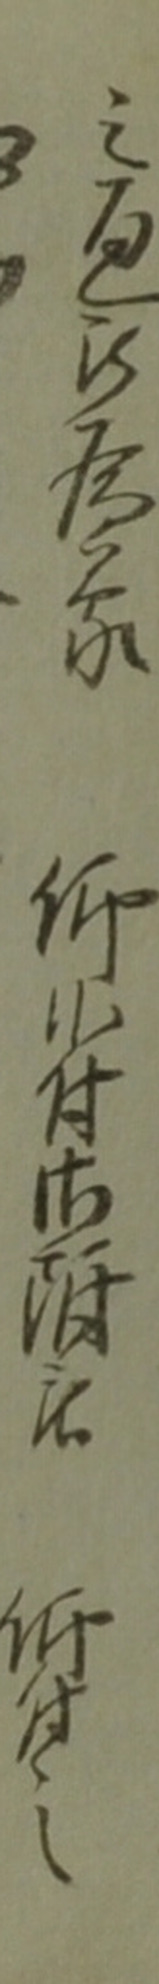之通被為蒙仰候付御附被仰付之
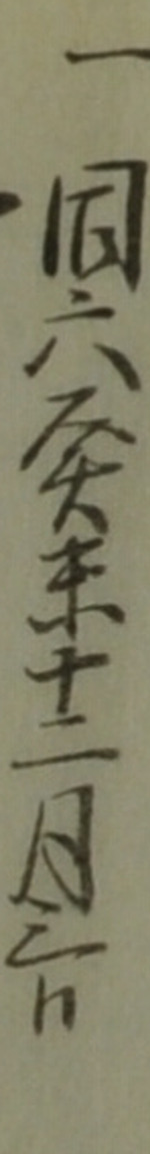一同六癸未十二月三日
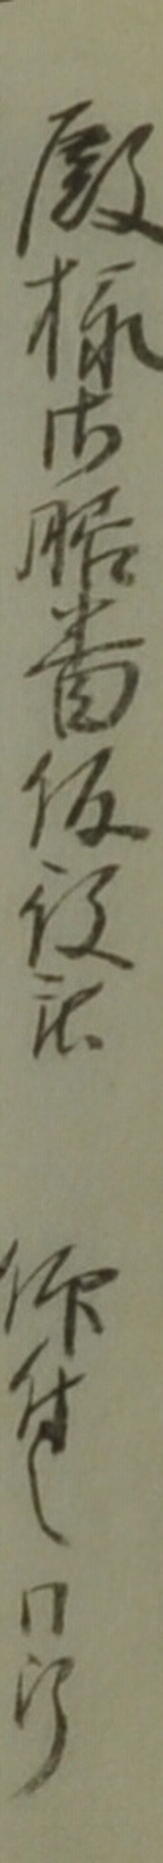殿様御膳番仮役被仰付之同断
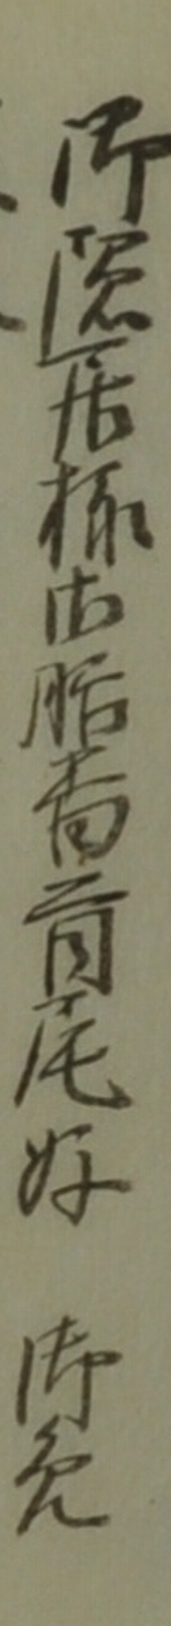御隠居様御膳番首尾好御免
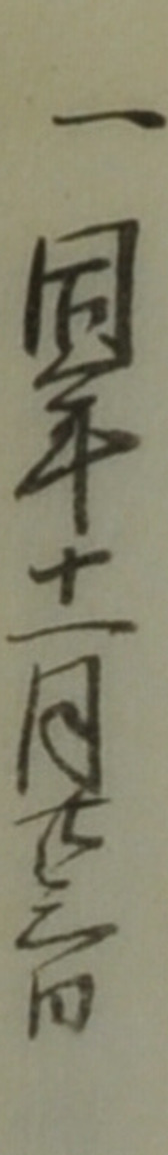一同年十一月廿三日
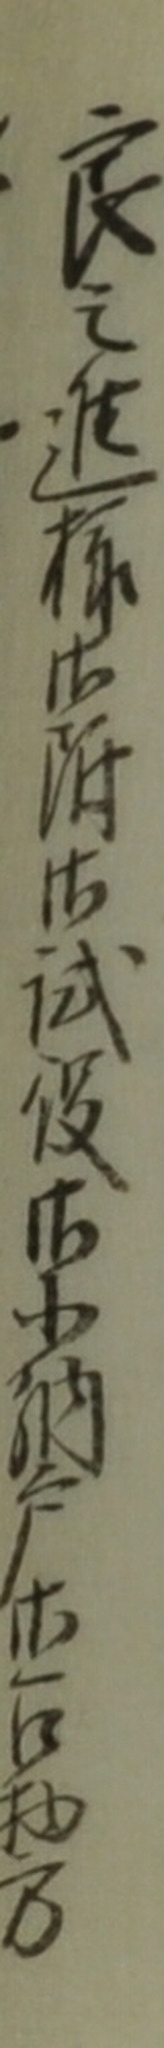良之進様御附御試役御小納戸御召物方
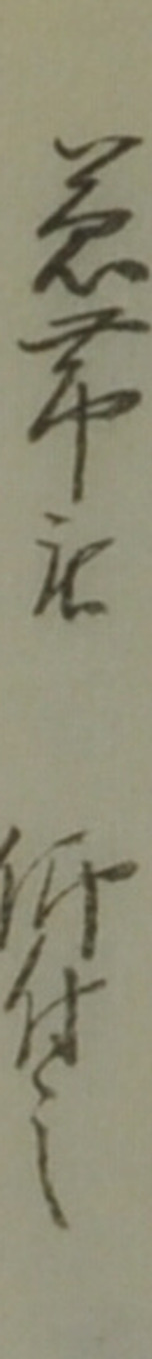兼帯被仰付之
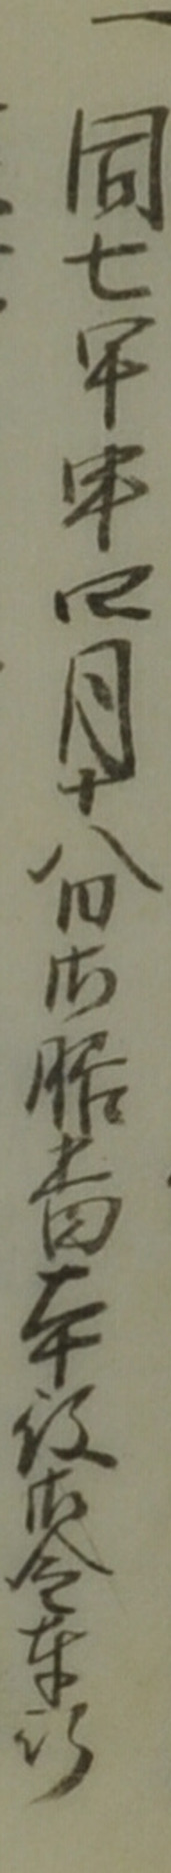一同七甲申四月十五日十八日御膳番本役御金奉行
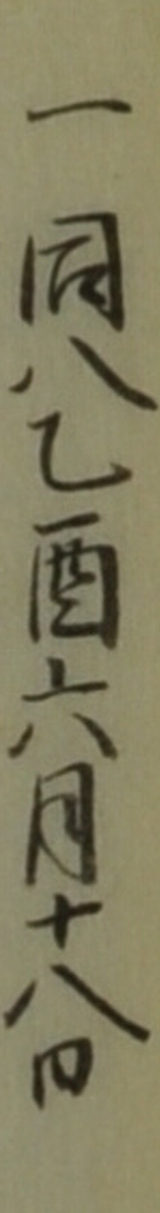一同八乙酉六月十八日
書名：諸御役代々録（五）
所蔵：伊那市立高遠町図書館・合同会社AMANE
